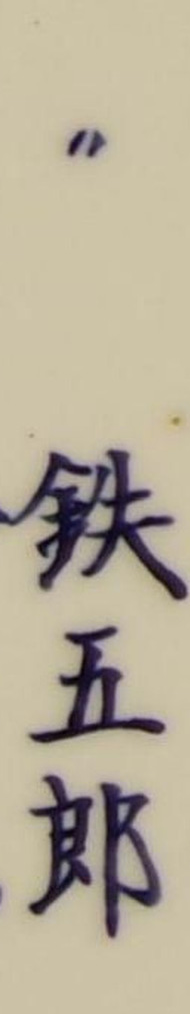鉄五郎
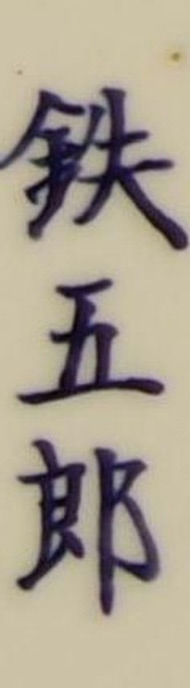鉄五郎
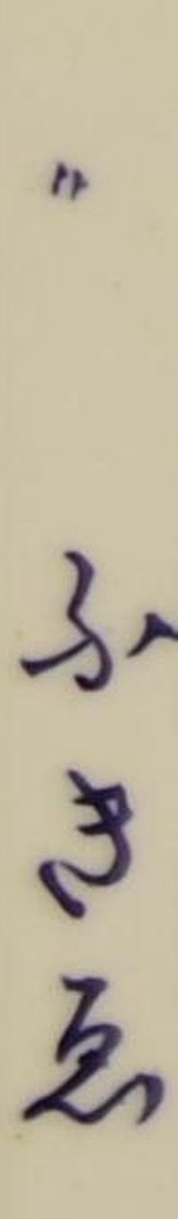ふきゑ
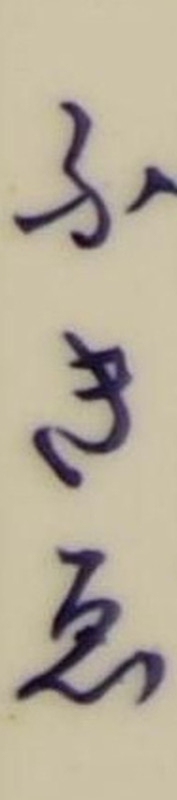ふきゑ

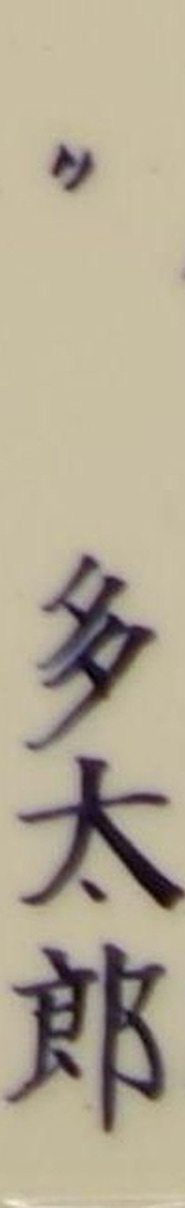多太郎
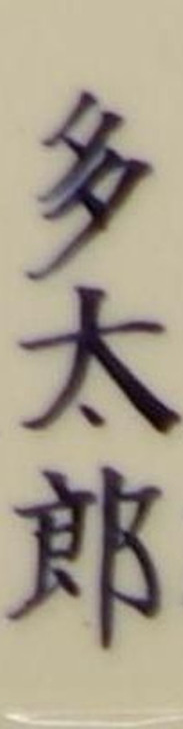多太郎
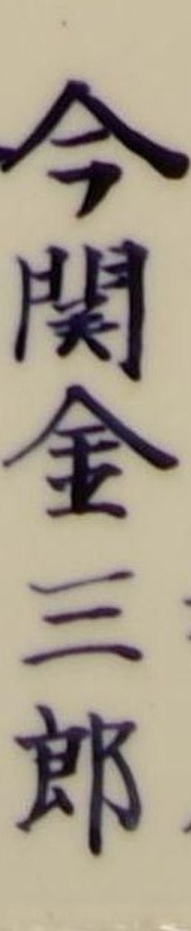今関金三郎
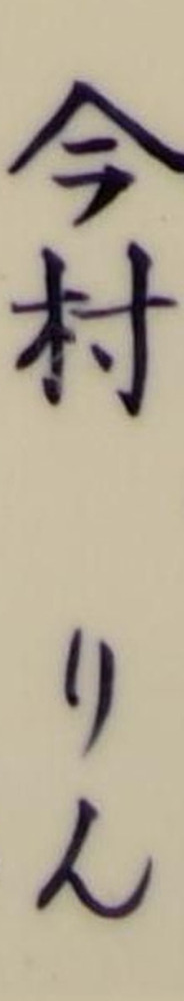今村りん
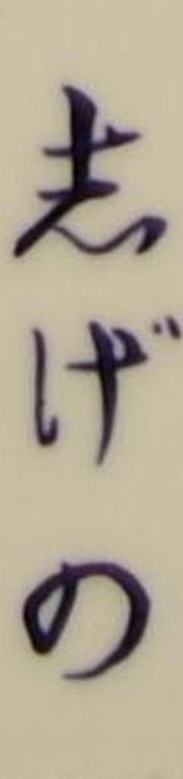しげの
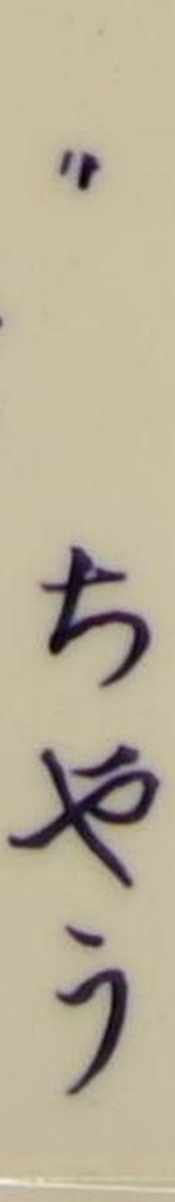ちやう
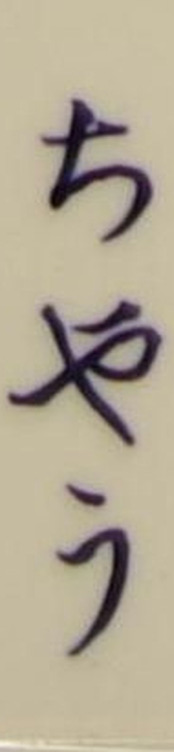ちやう
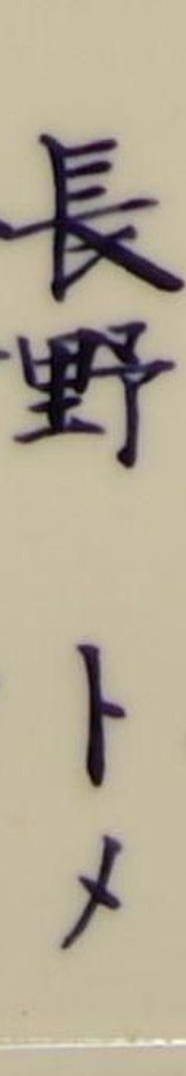長野トメ
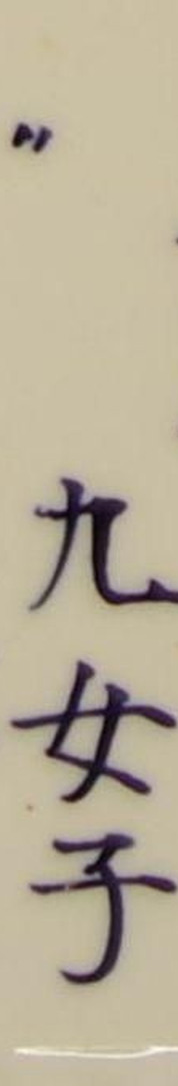九女子
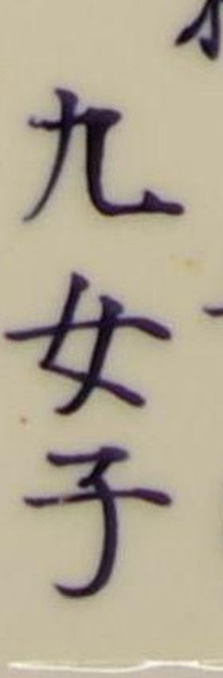九女子
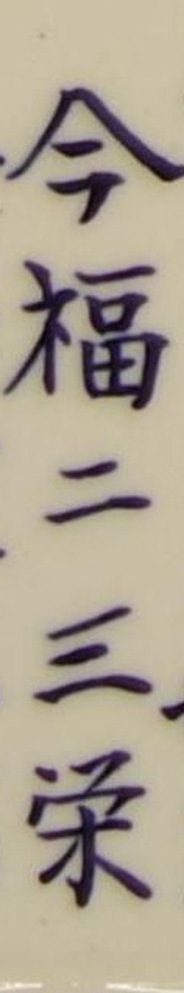今福二三栄
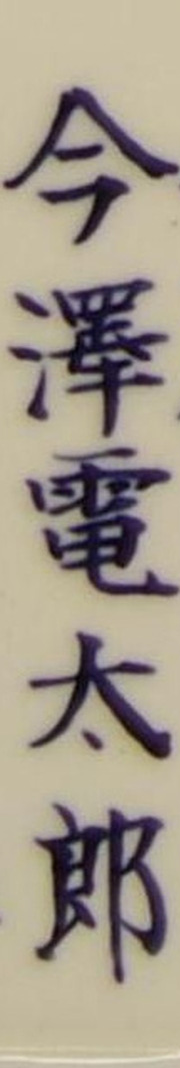今澤電太郎
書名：A~D
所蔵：koyasan kongobuji
